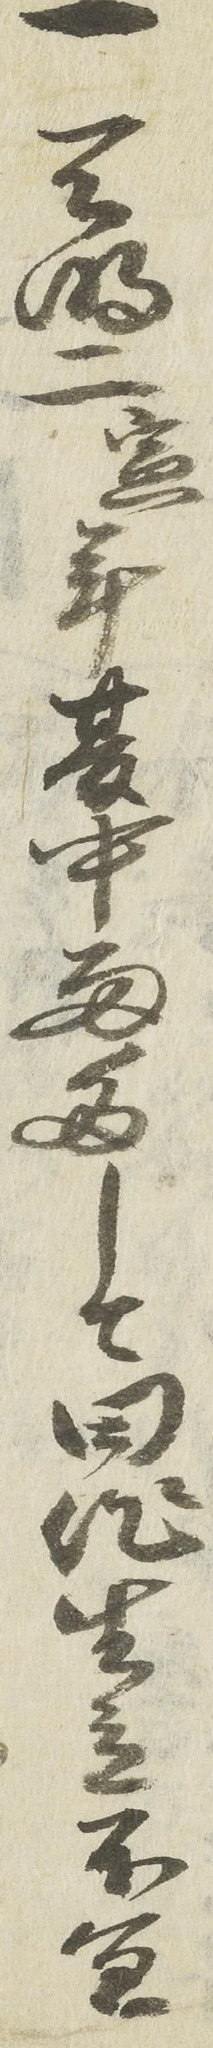一天明二寅年夏中雨多しと田作生立不宣
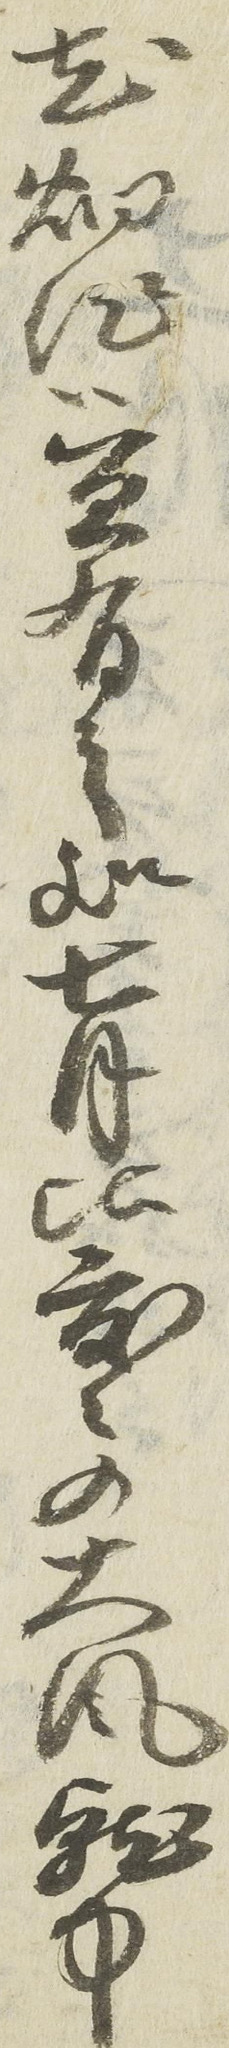尤畑作は宜有之処七月頃度々の大風就中
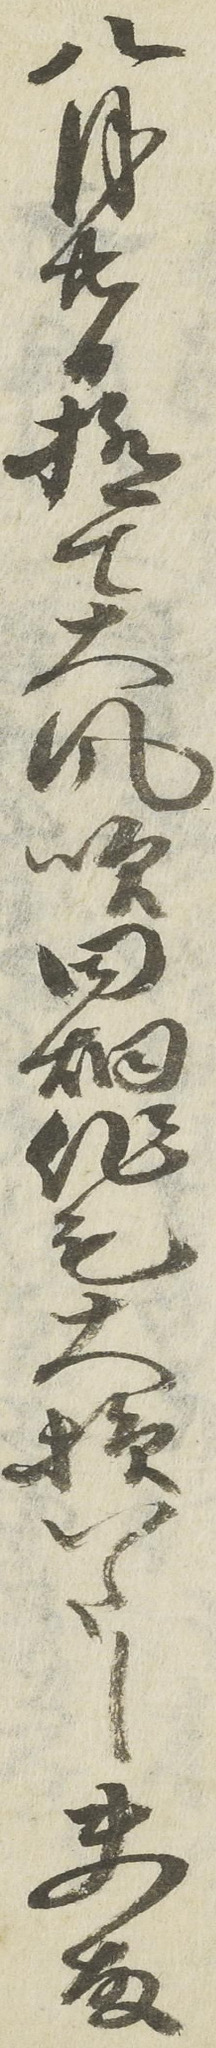八月廿日極て大風吹田畑作毛大損いたし夫故
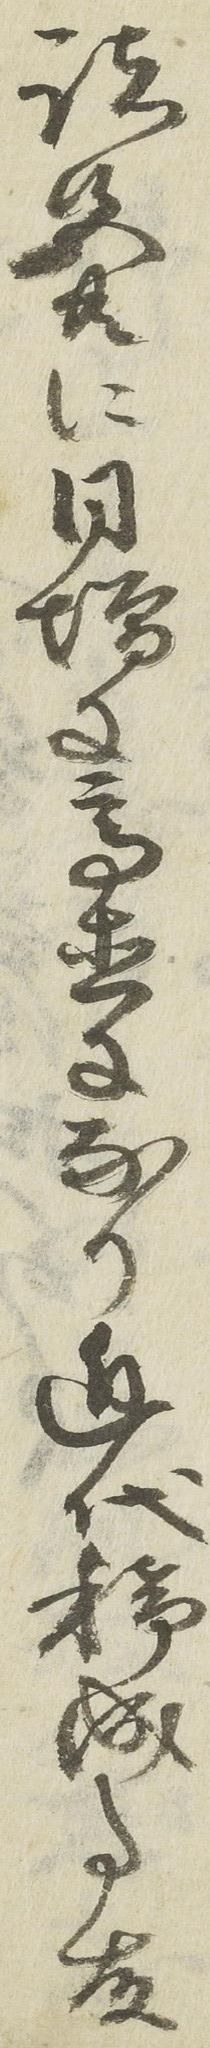諸色共に日増に高直になり近代稀成事故
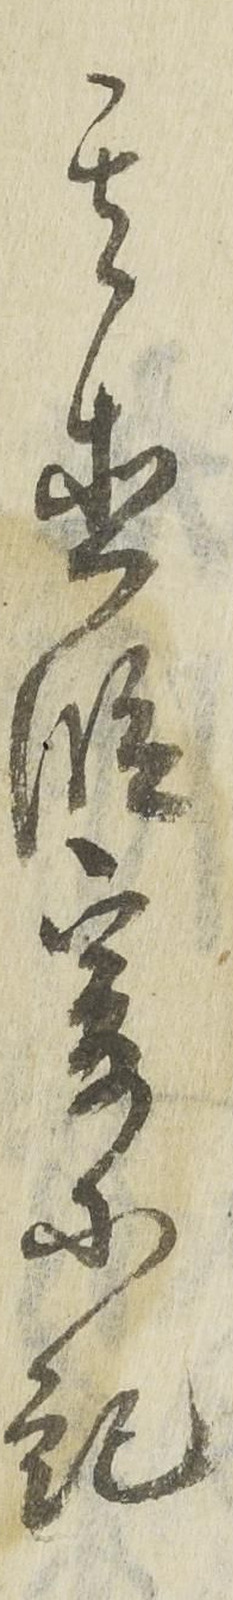其直段爰に記

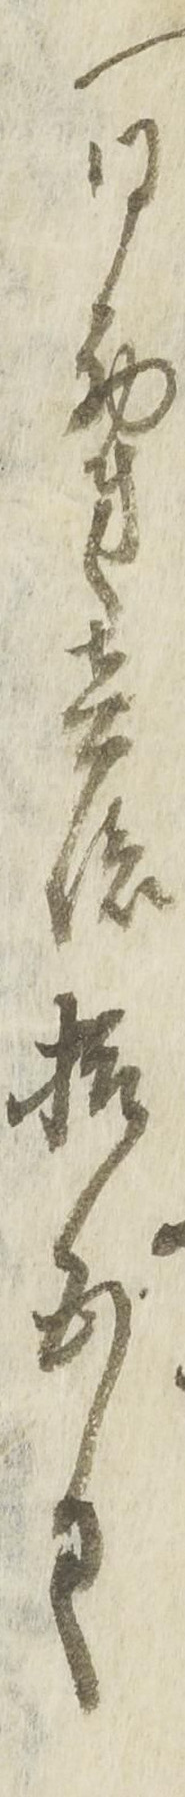同粟壱俵拾五匁
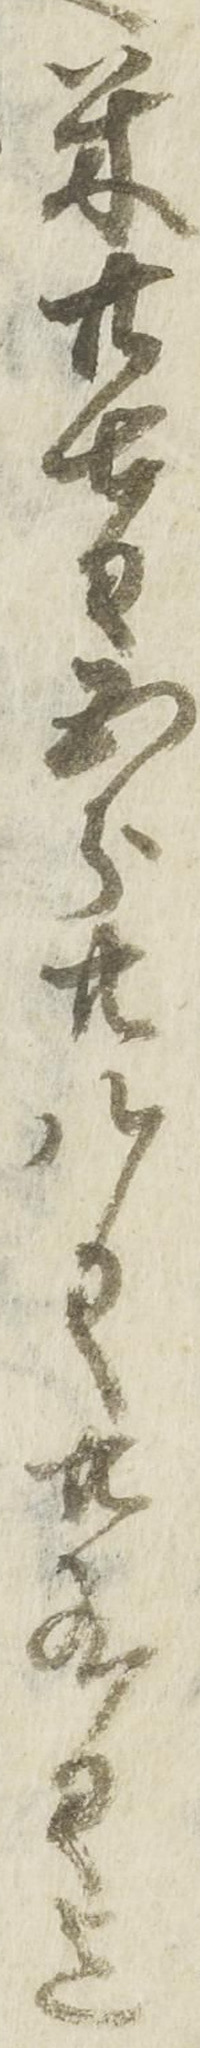十月米廿七匁五分廿八匁廿九匁迄
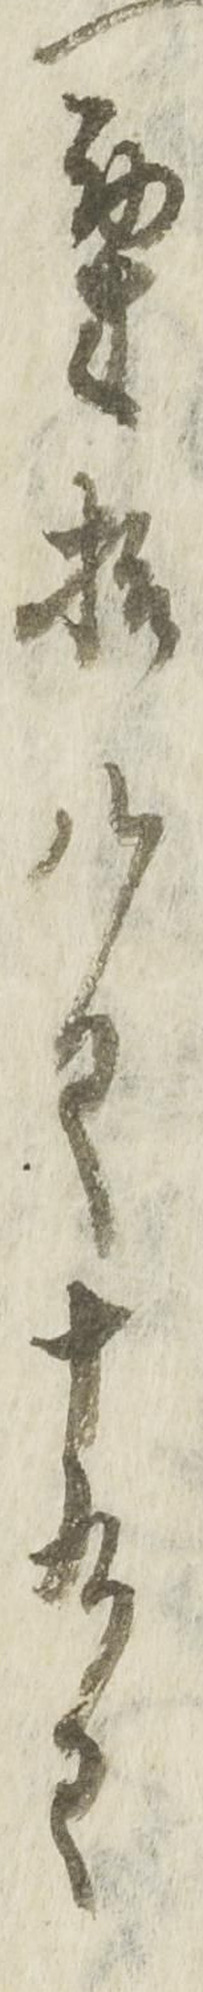粟拾八匁十九匁
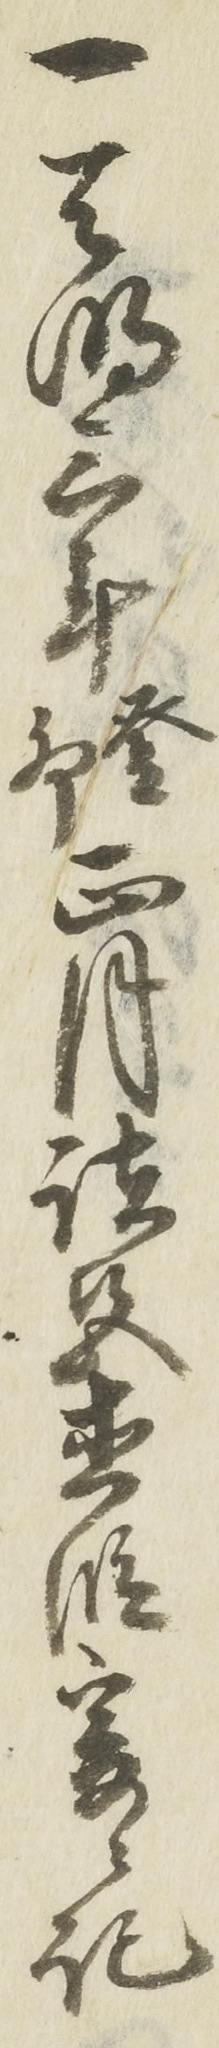一天明三年癸卯正月諸色直段爰ニ記
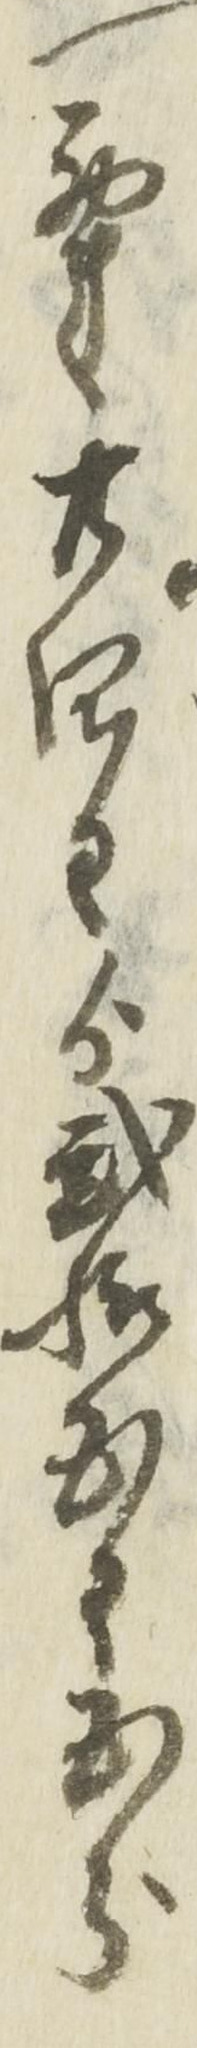粟廿四匁ゟ弐拾五匁五分
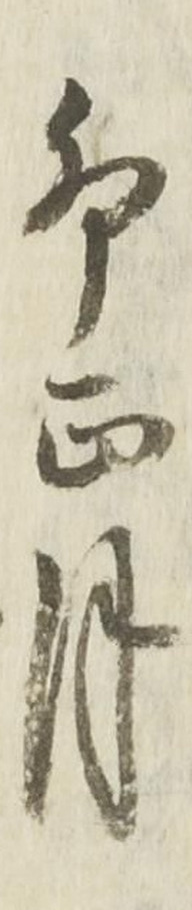卯正月
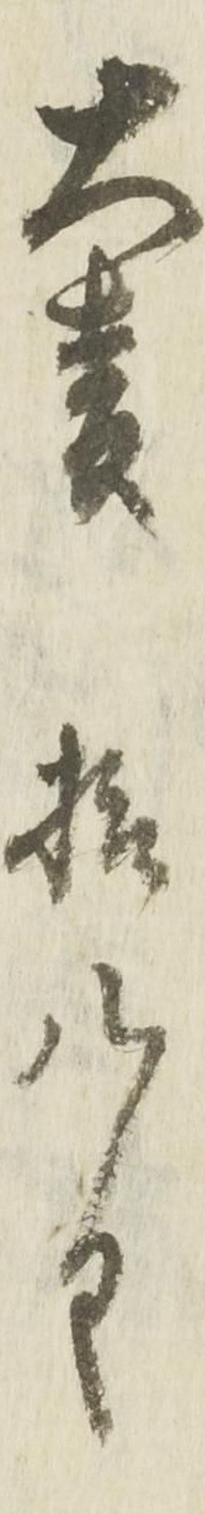大麦拾八匁
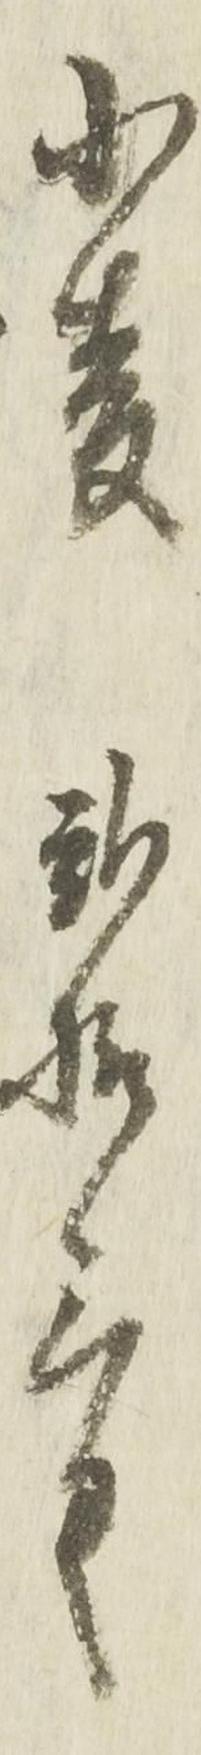小麦弐拾三匁
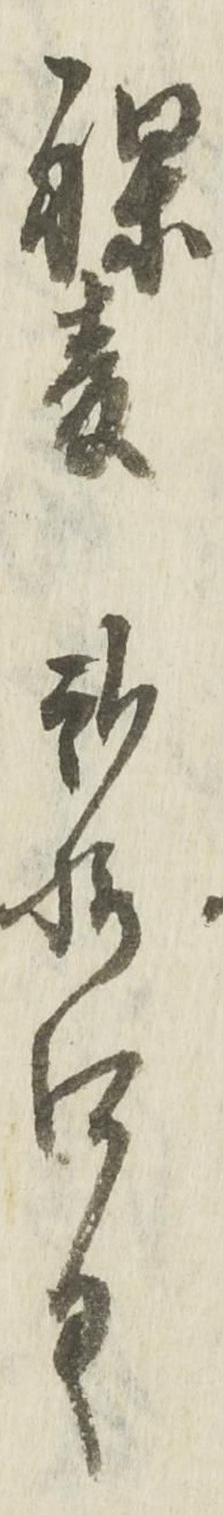裸麦弐拾四匁
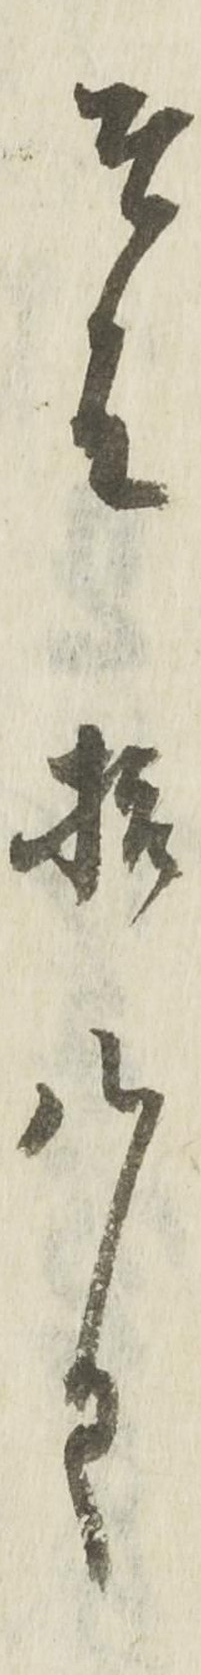そは拾八匁
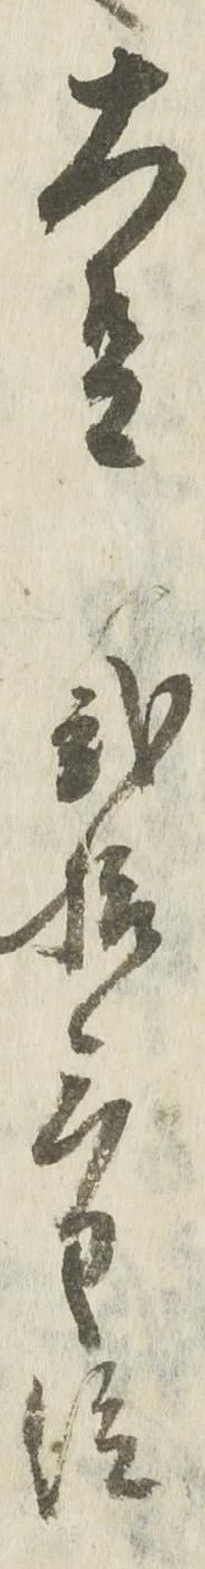大根実弐拾七匁位
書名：後見笑
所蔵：東京大学地震研究所図書室 Earthquake Research Institute Library, The University of Tokyo, JAPAN
